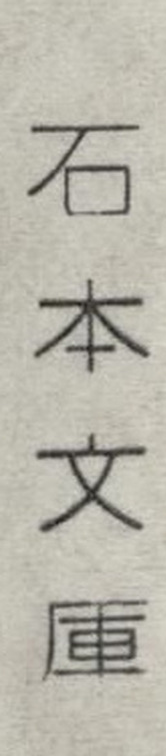石本文庫
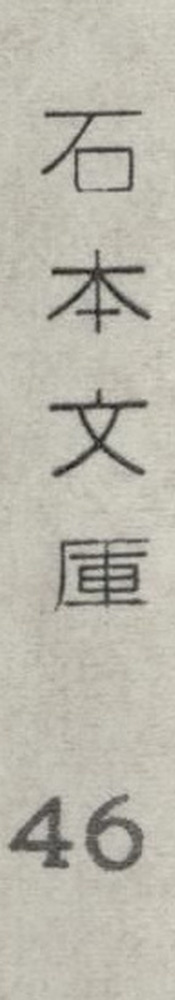石本文庫

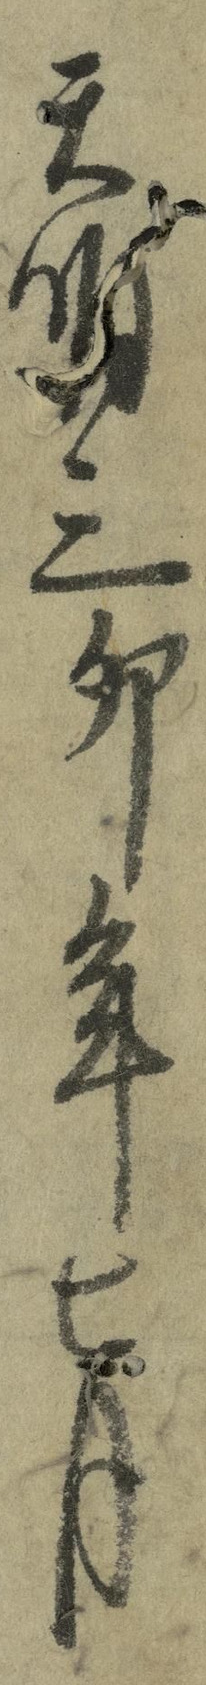天明三卯年七月
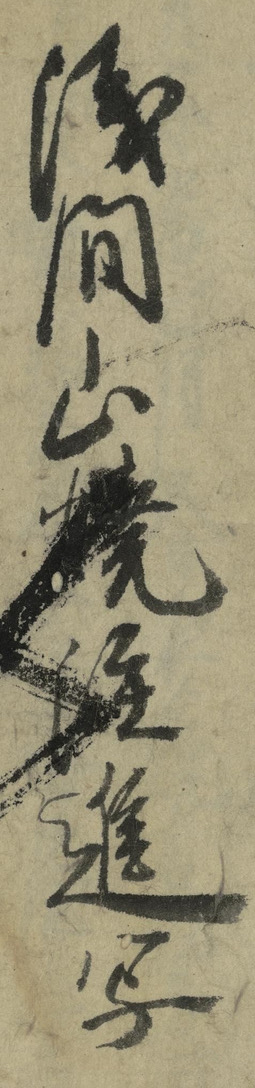浅間山焼注進写

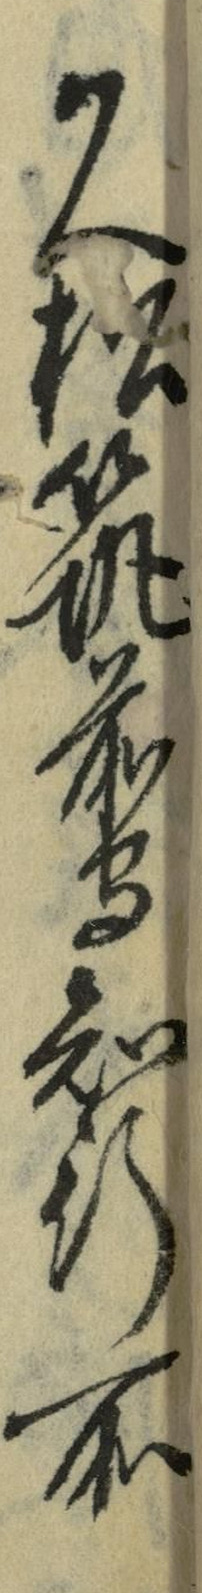久松筑前守知行所
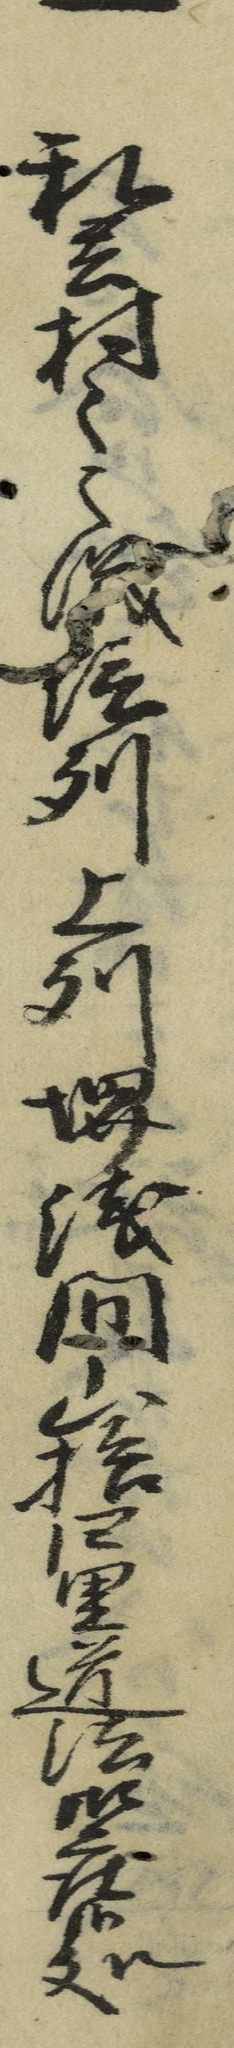一私共村々之儀信州上州堺浅間山拾四里道法御座候処
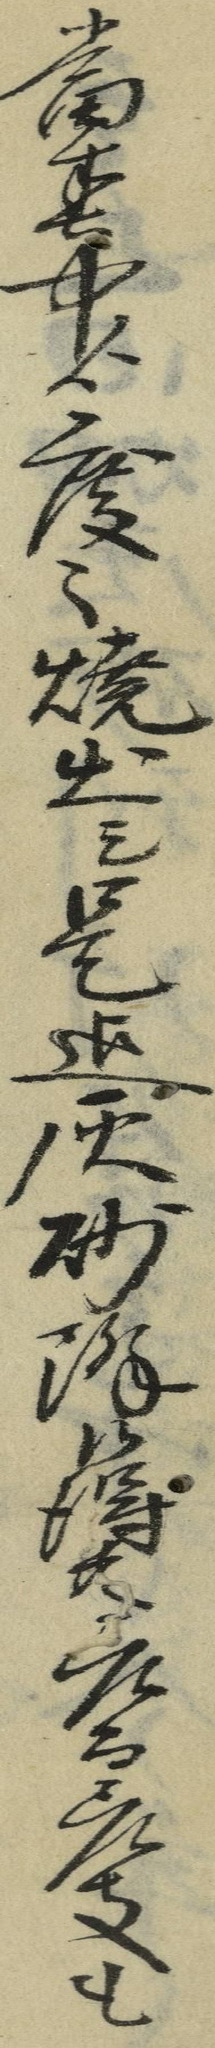当春中ゟ度々焼出シ是迄灰砂降候得共差而差支も
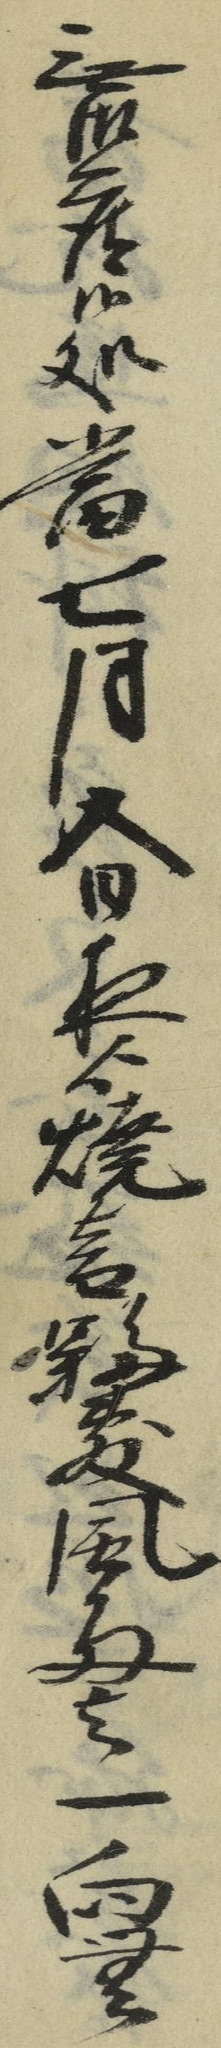無御座候処当七月五日夜ゟ焼音夥敷風雨は一向無
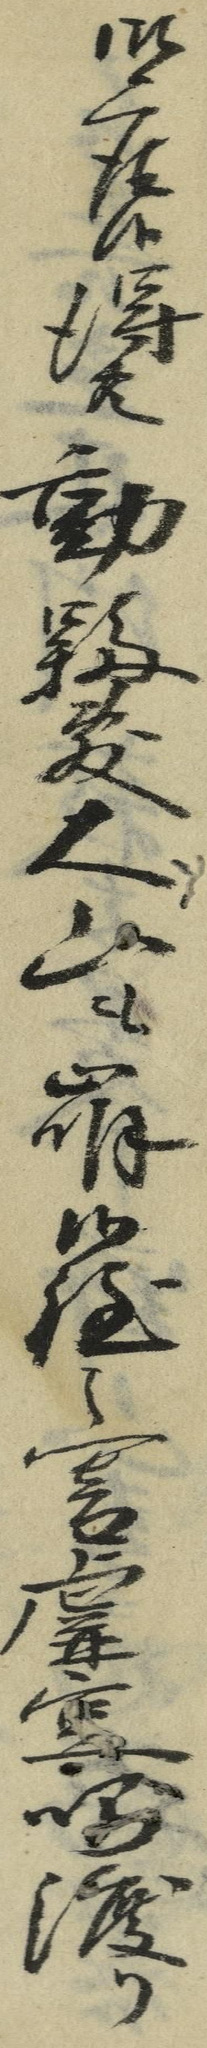御座候得共動夥敷大山も崩候程之闇虚空鳴渡り
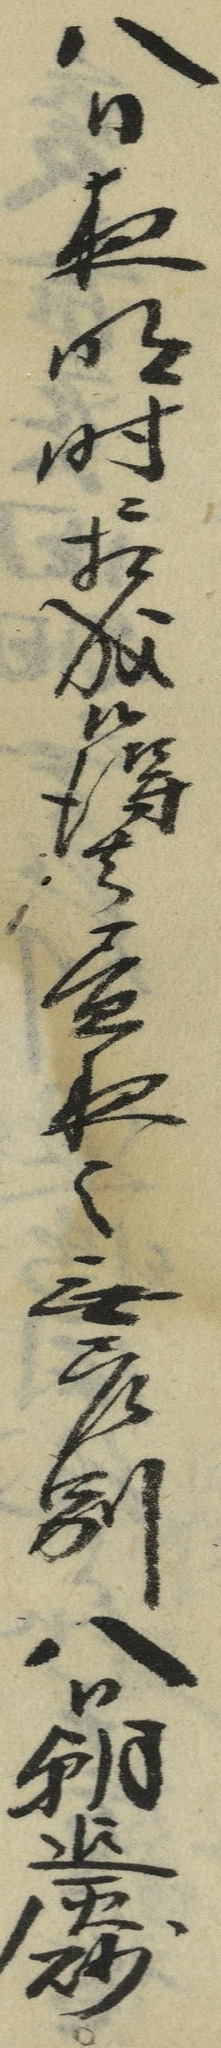八日夜明時に相成候得者昼夜之無差別八日朝迄灰砂
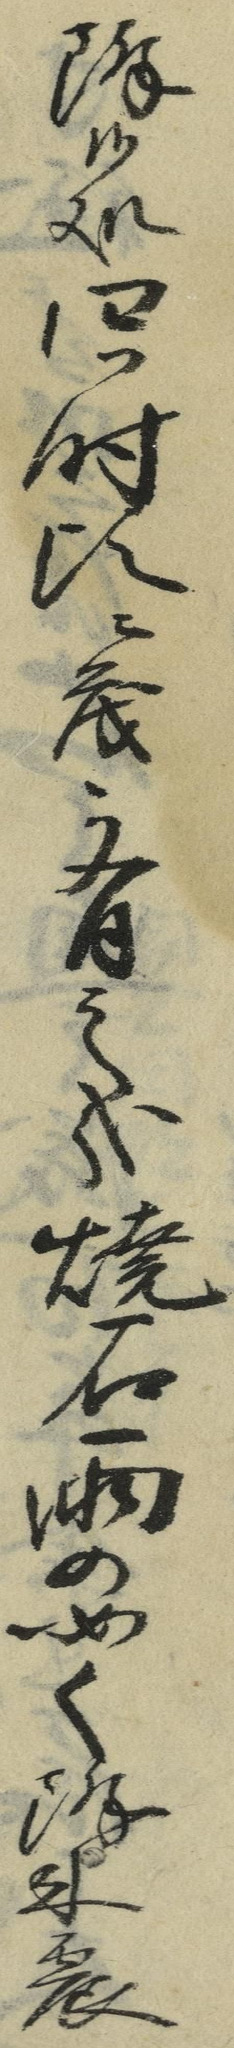降候処四ツ時頃にも可有之や焼石雨の如く降来震
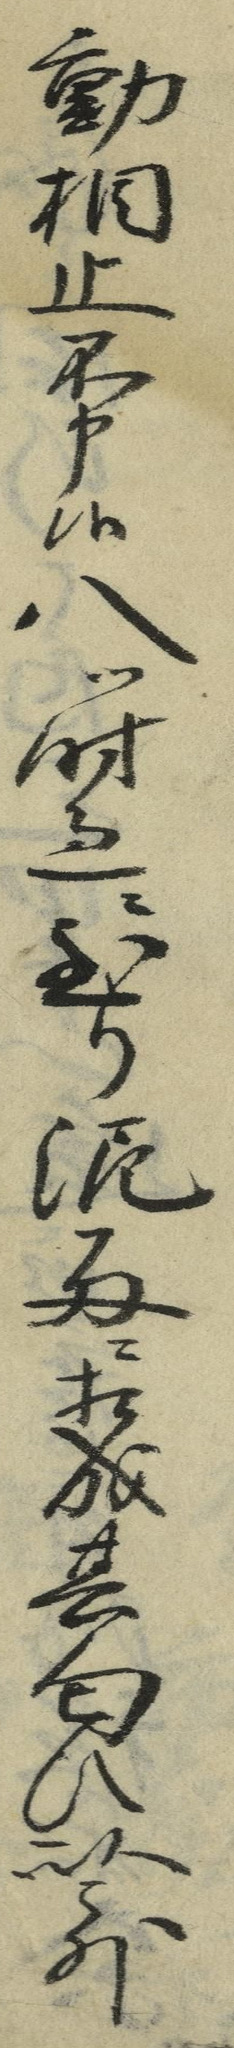動相止不申候八ツ時過に至り泥雨に相成甚匂ひ以之外
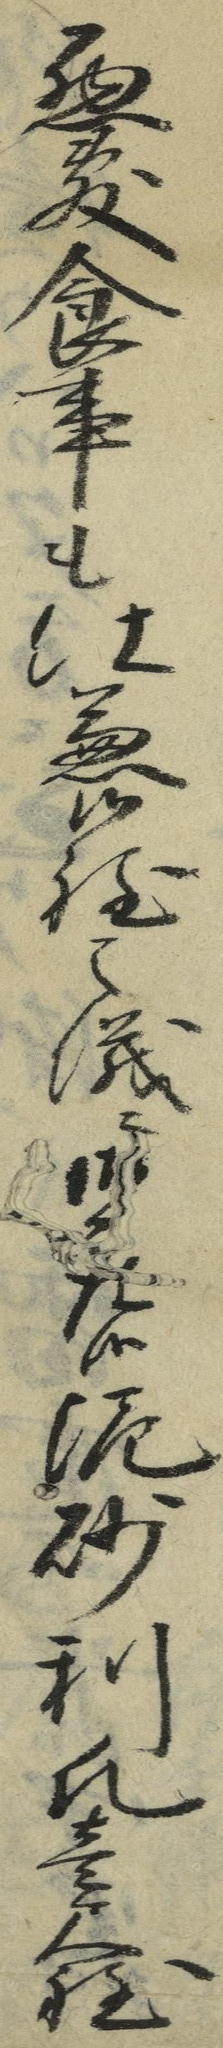悪敷食事も仕兼候程之儀に御座候泥砂利凡壱尺程

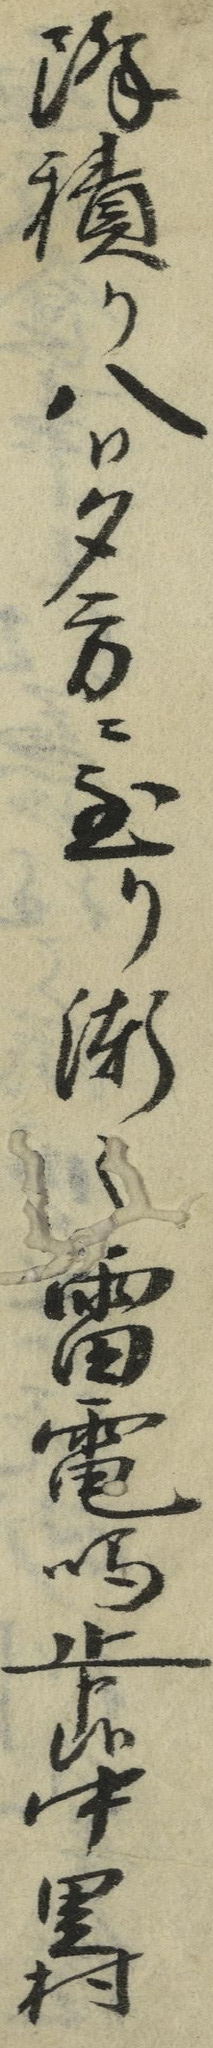降積り八日夕方に至り漸く雷電鳴止申候中里村
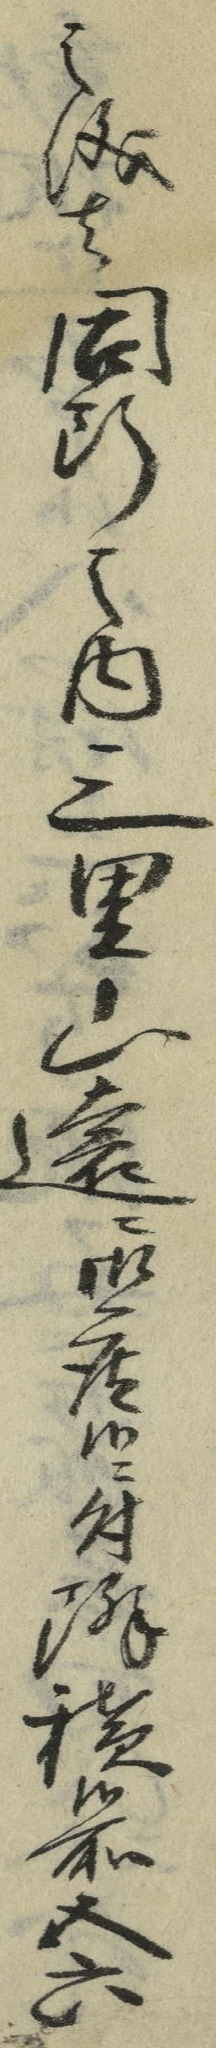之儀は同断之内三里山遠に御座候に付降積候所五六
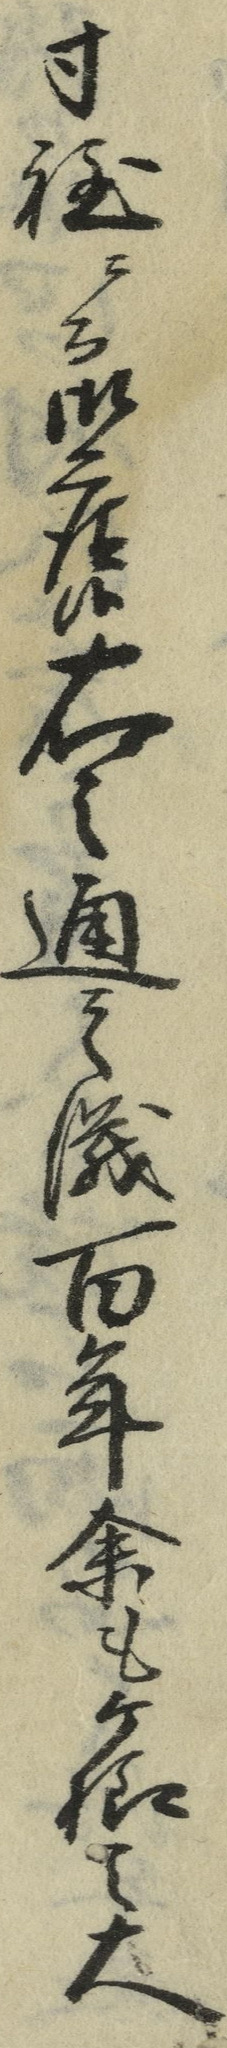寸程に而御座候右之通之儀百年余も个様は大
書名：天明三卯年七月　浅間山焼注進写
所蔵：東京大学地震研究所図書室 Earthquake Research Institute Library, The University of Tokyo, JAPAN
